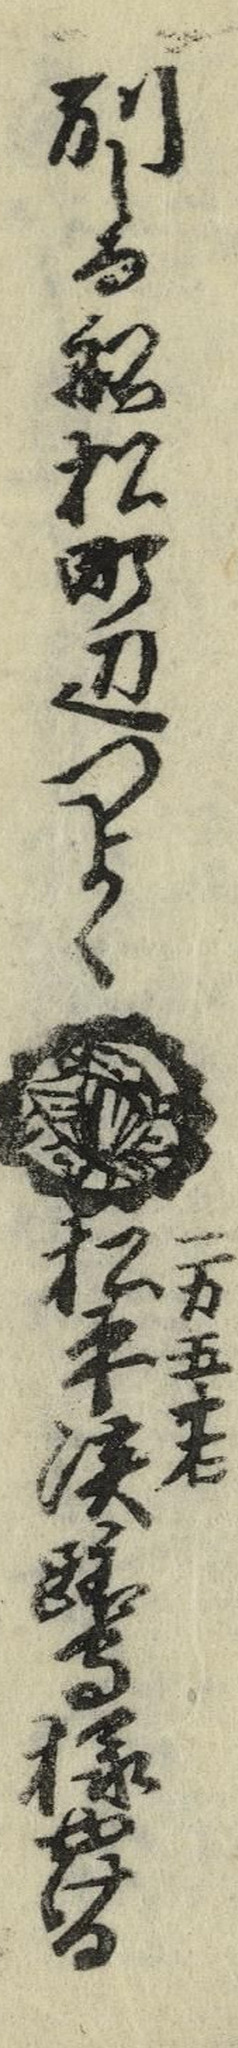別し而船松町辺つよく松平淡路守様やける
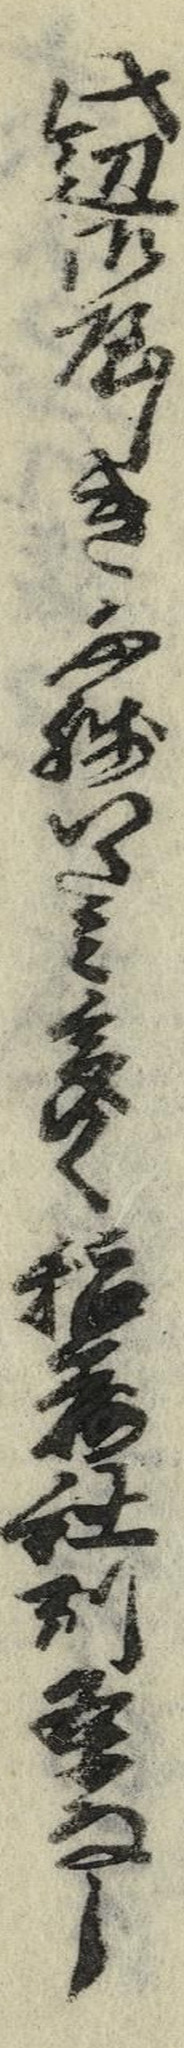此辺御屋しき不残いたみ多く稲荷社別条なし
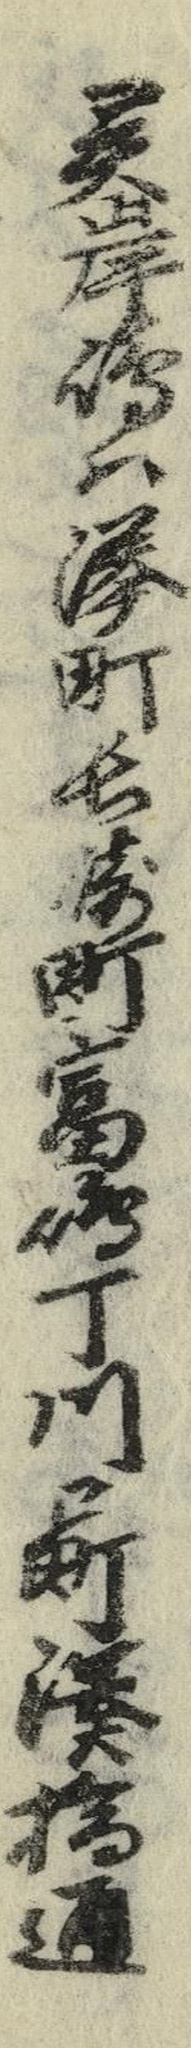霊岸島は湊町長﨑町富嶋丁川口町湊橋通
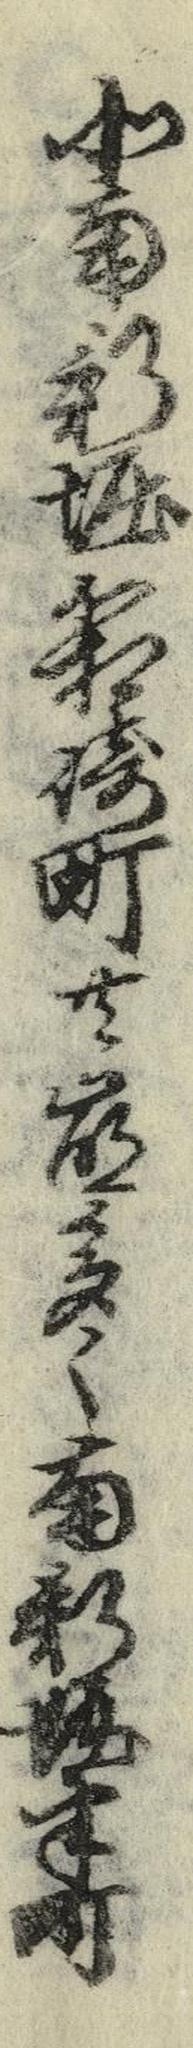北南新堀箱﨑町共崩多く南新堀半町
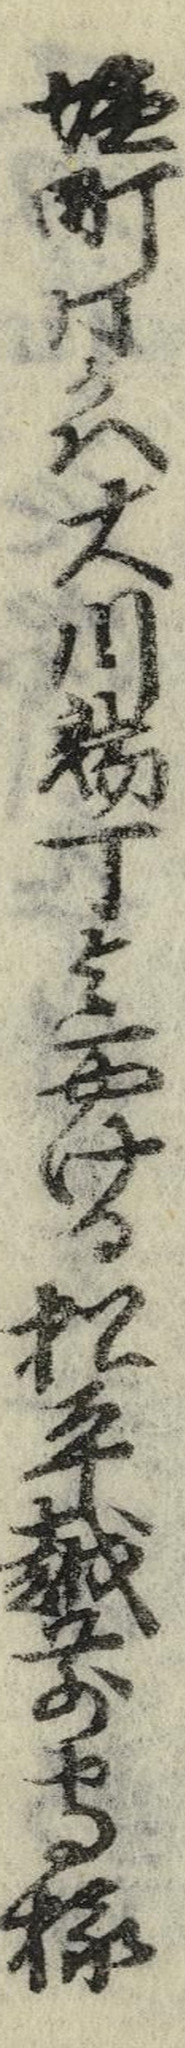塩町片かは大川端丁迄やける松平越前守様
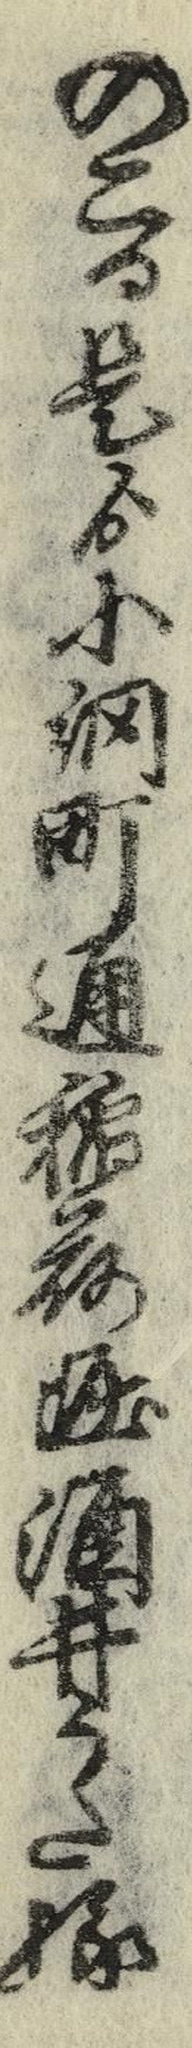のこる是ゟ小網町通稲荷堀酒井うた様
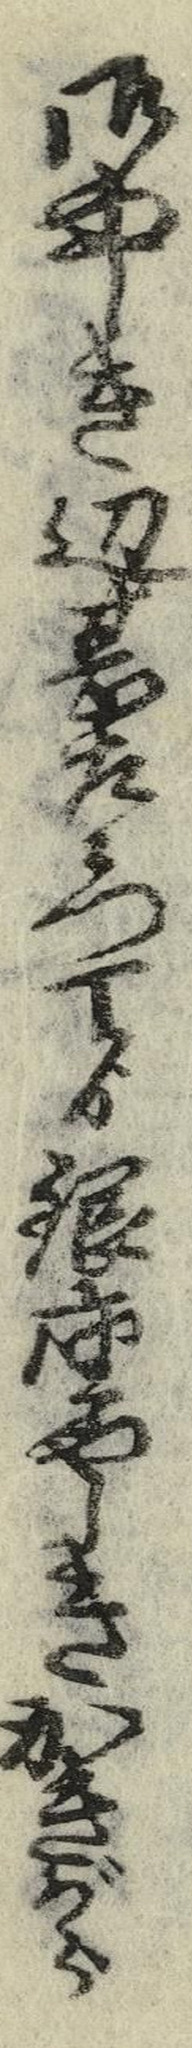御やしき辺甚左衛門丁ゟ銀座やしきかきがら
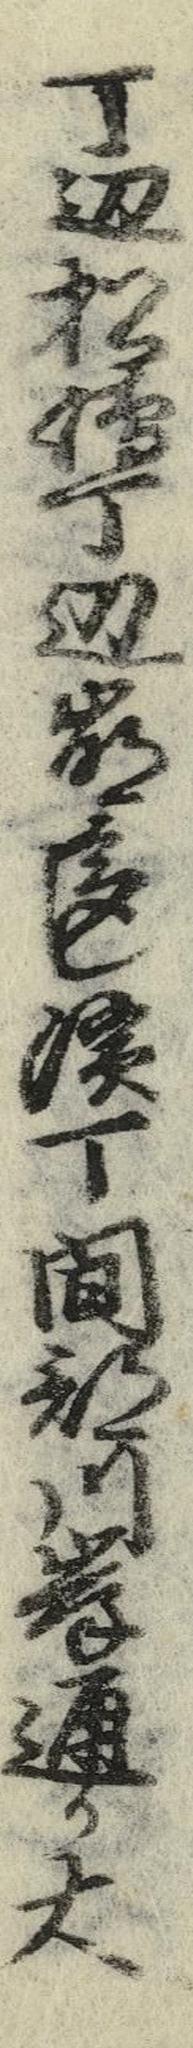丁辺松嶋丁辺崩多し濱丁間部川岸通り大
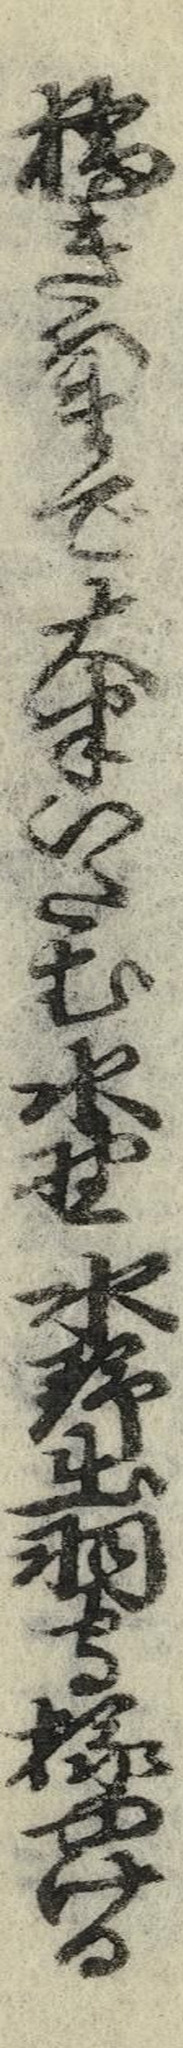橋きわまで大半いたむ水野水野出羽守様やける
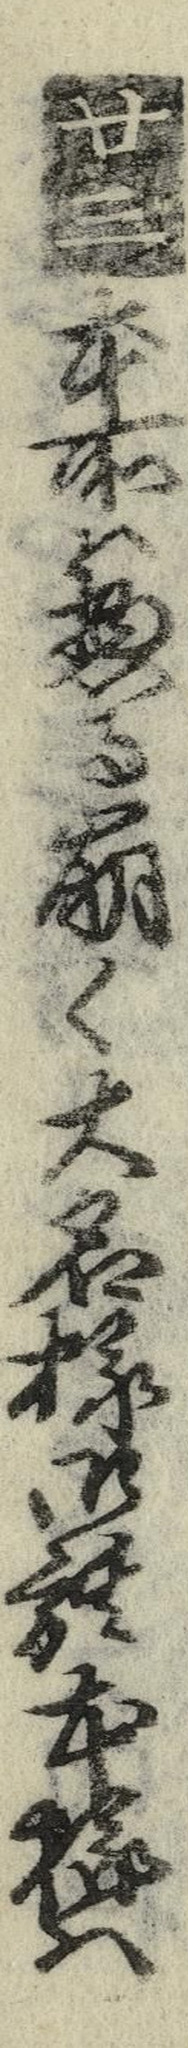廿三本所は惣寺崩く大名様御旗本様は
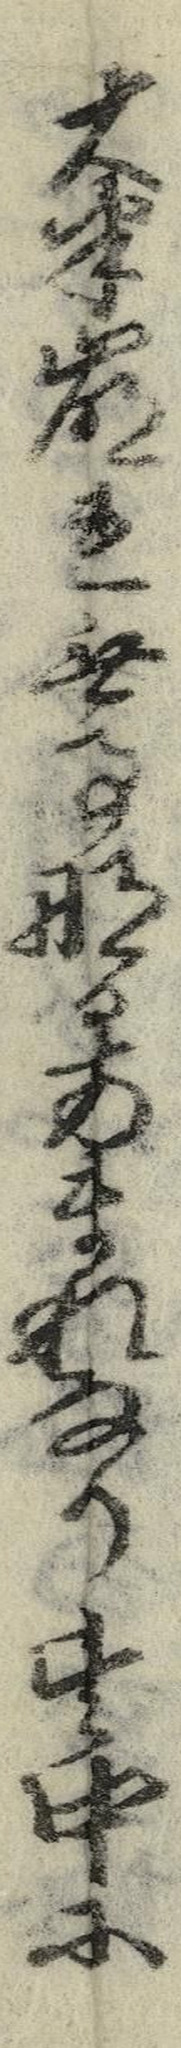大半崩れ無事なる方まれなり其中に
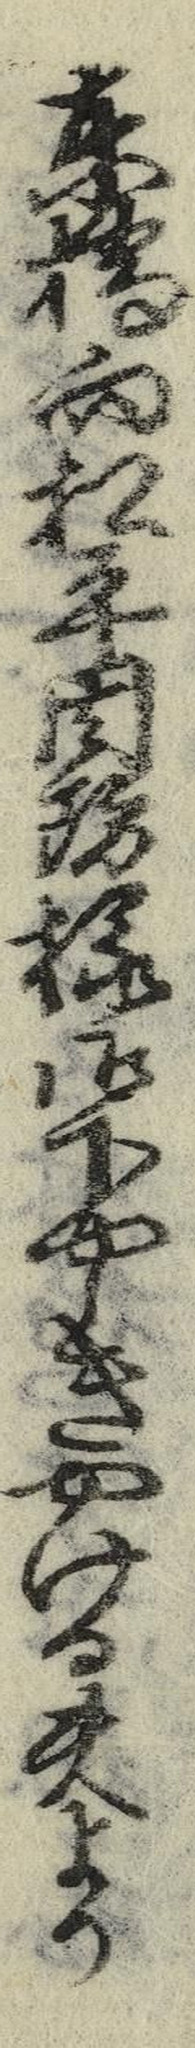東橋向松平周防様御下やしきやける夫より
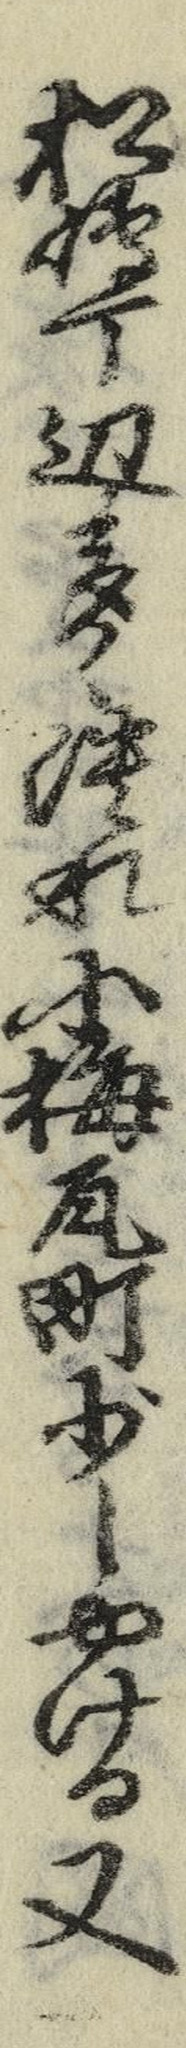松島丁辺多く潰れ小梅瓦町少しやける又
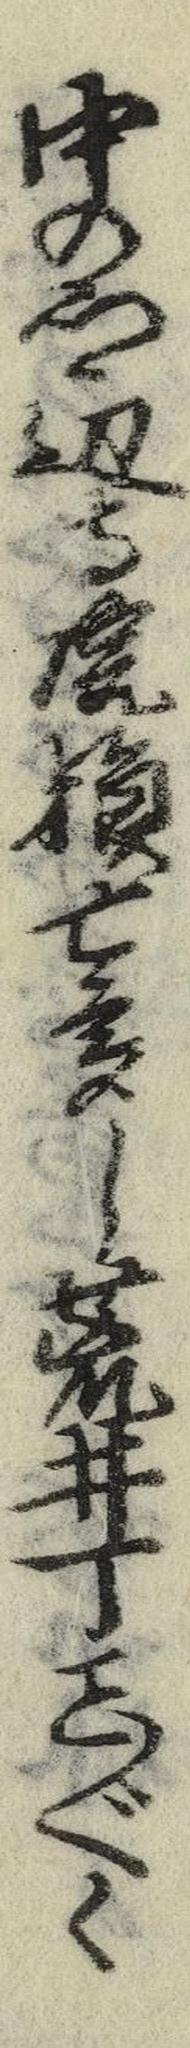中の郷辺寺院損亡多し荒井丁ことごとく
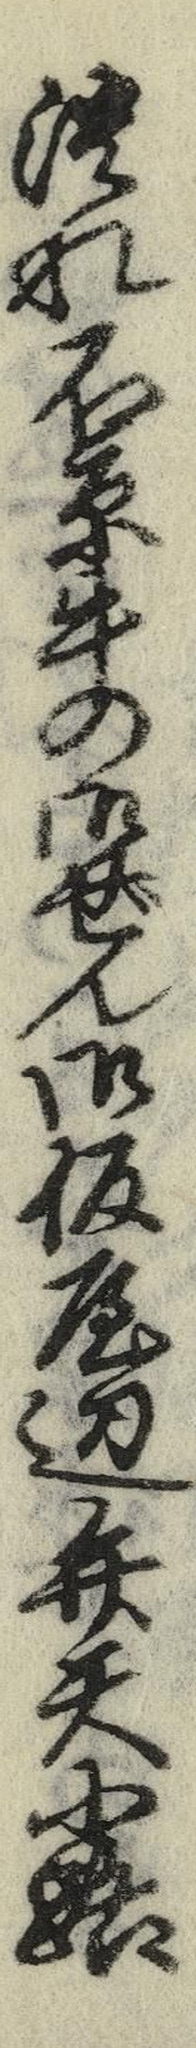潰れ石原牛の御ぜん御仮屋辺弁天小路
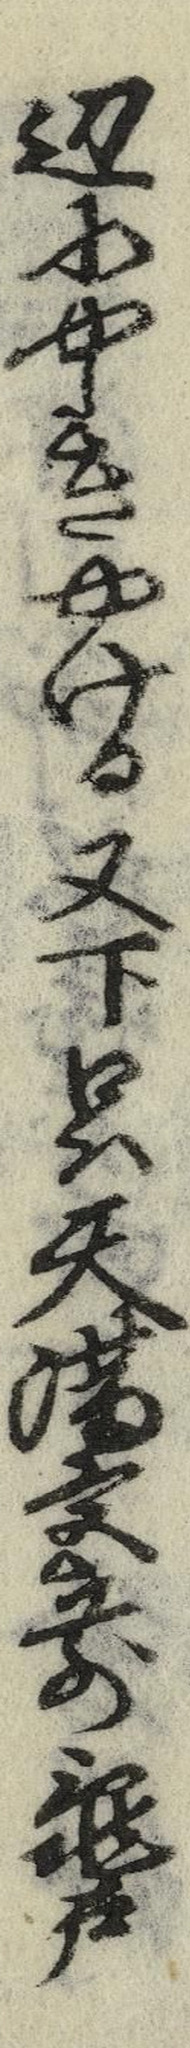辺小やしきやける又一ト口は天満宮前亀戸
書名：地震類焼場所明細書之写　安政二卯年十月二日夜四ツ時過　御府内御屋敷方市中共、并街道筋近郷聞書
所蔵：東京大学地震研究所図書室 Earthquake Research Institute Library, The University of Tokyo, JAPAN
